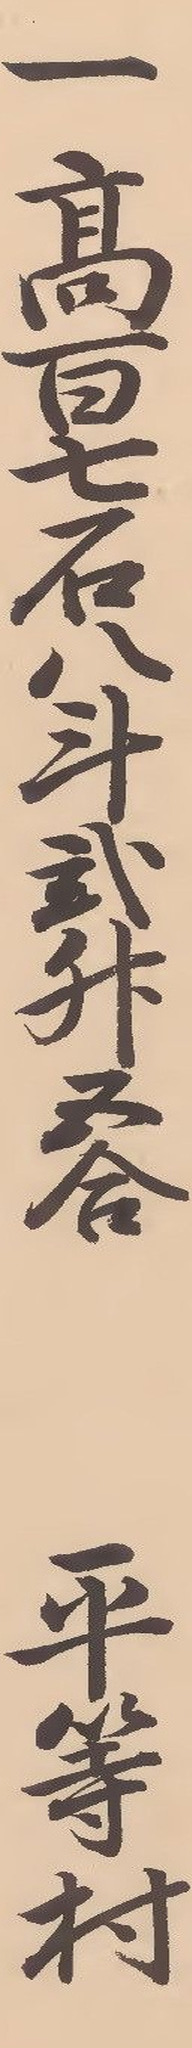一高百七石八斗弐升五合平等村

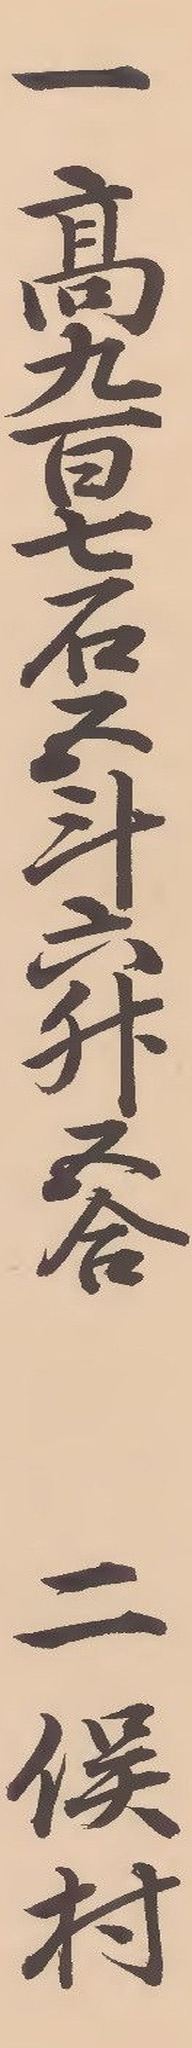一高九百七石五斗六升五合二俣村
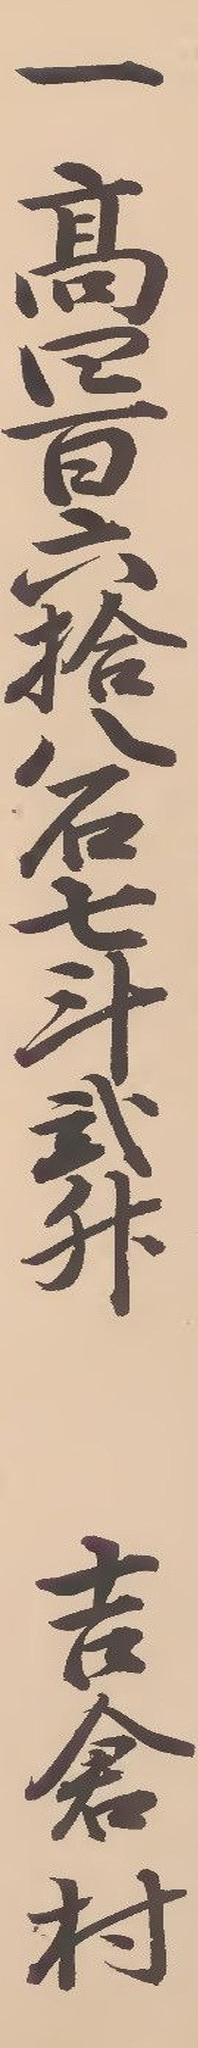一高四百六拾八石七斗弐升吉倉村
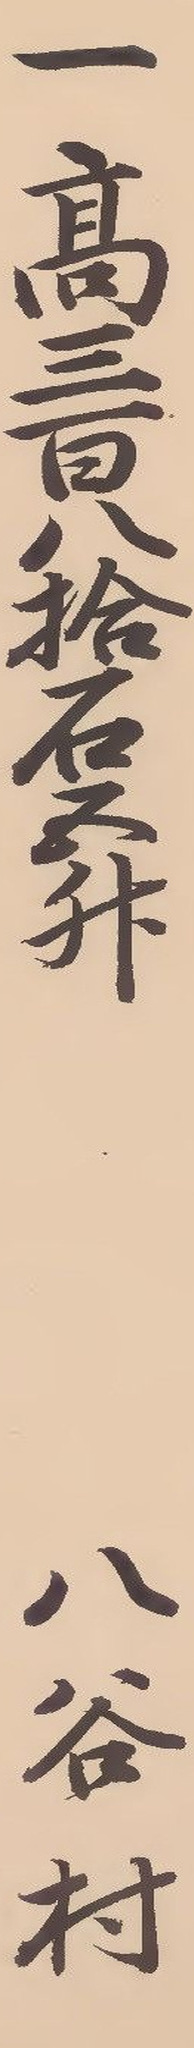一高三百八拾石五升八谷村

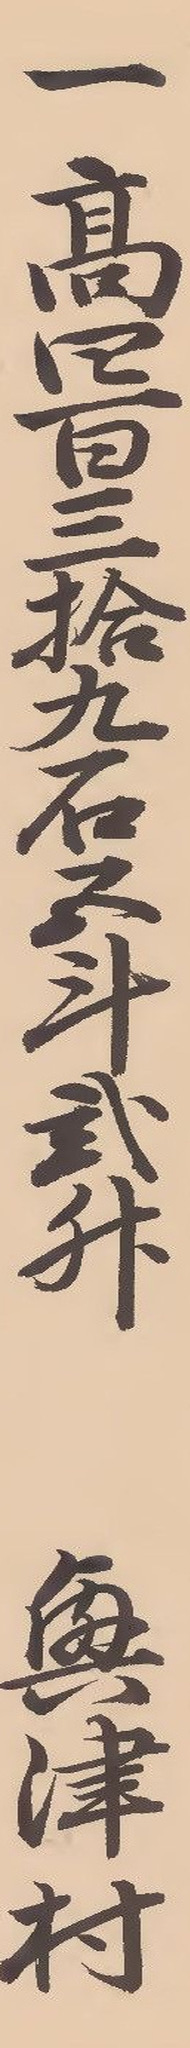一高四百三拾九石五斗弐升興津村
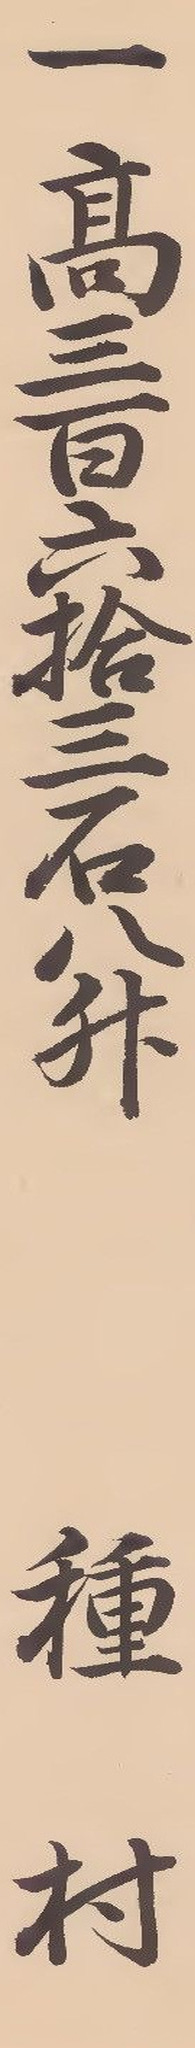一高三百六拾三石八升種村
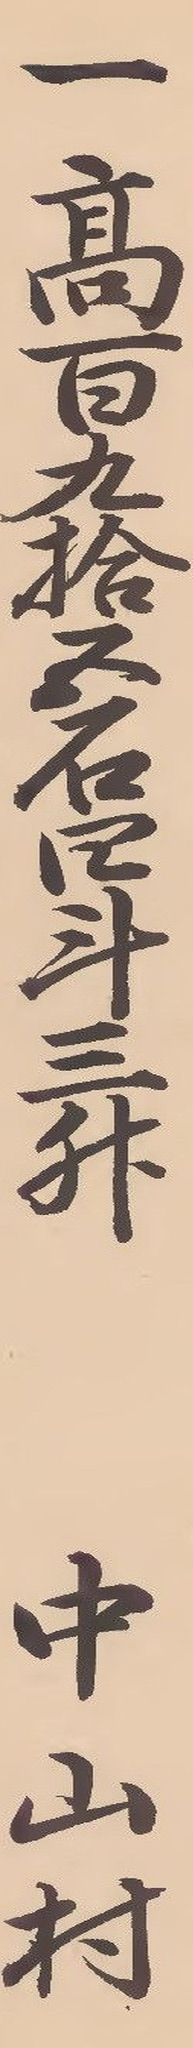一高百九拾五石四斗三升中山村
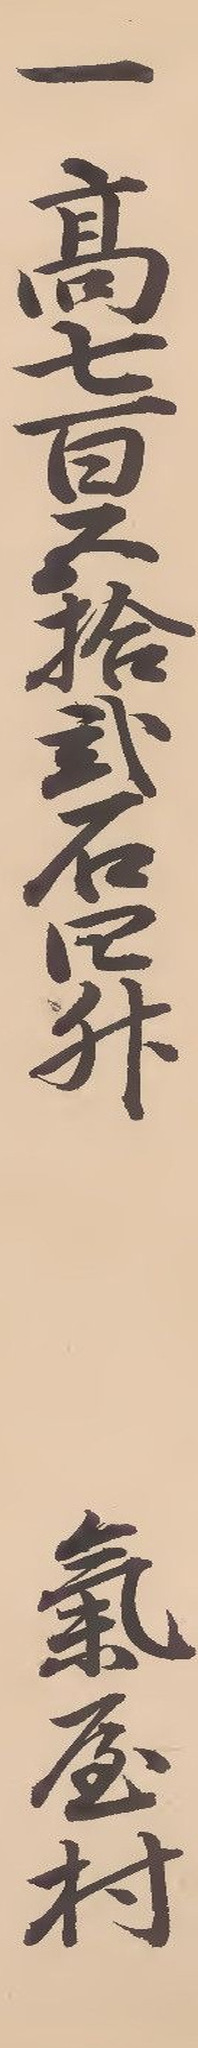一高七百五拾弐石四升気屋村
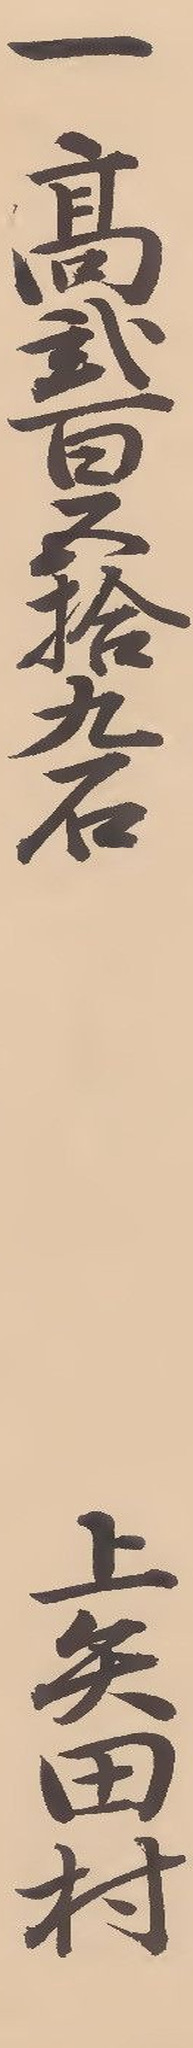一高弐百五拾九石上矢田村

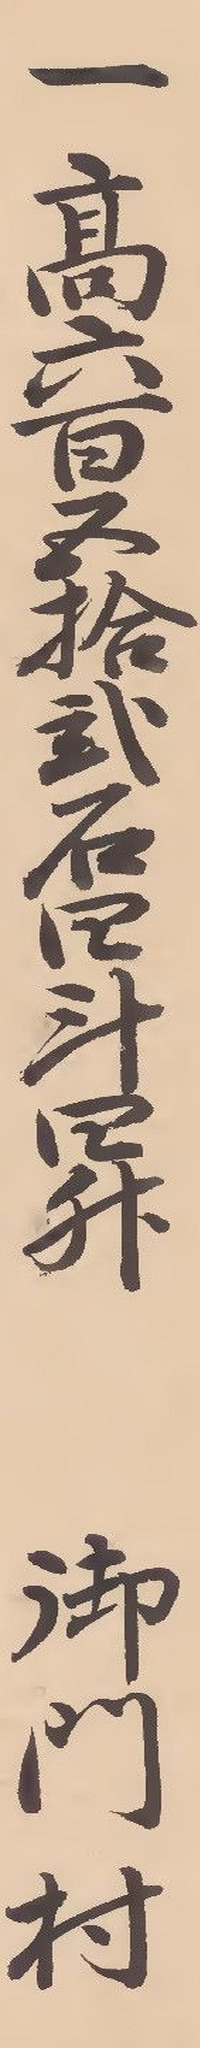一高六百五拾弐石四斗四升御門村
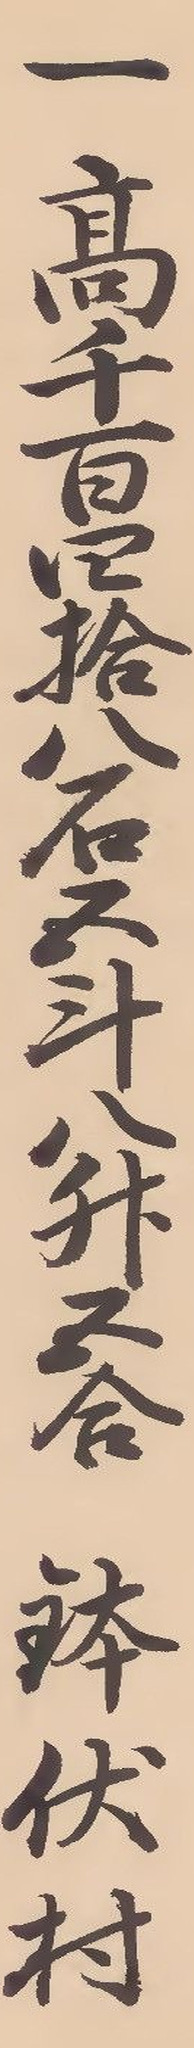一高千百四拾八石五斗八升五合鉢伏村
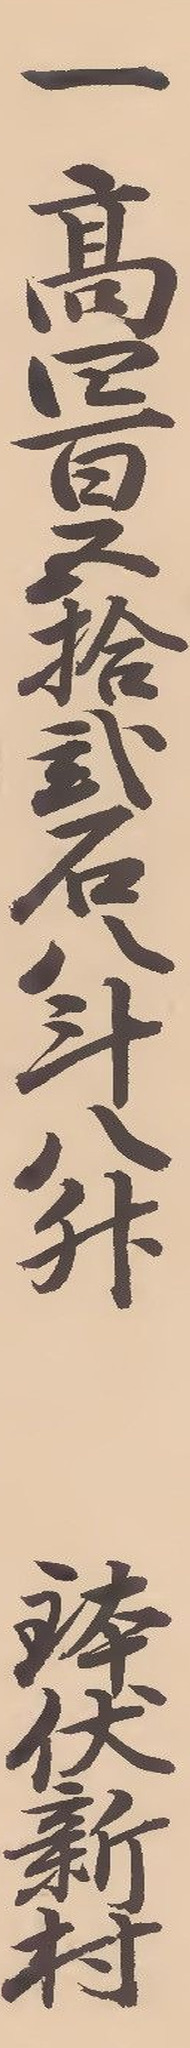一高四百五拾弐石八斗八升鉢伏新村
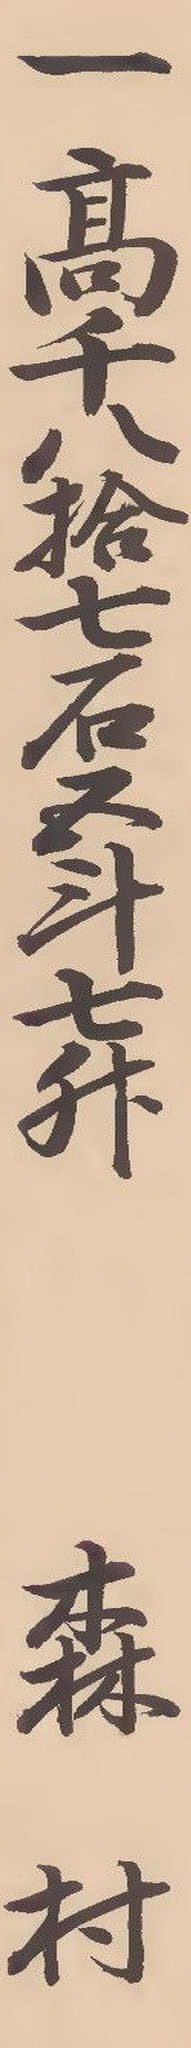一高千八拾七石五斗七升森村
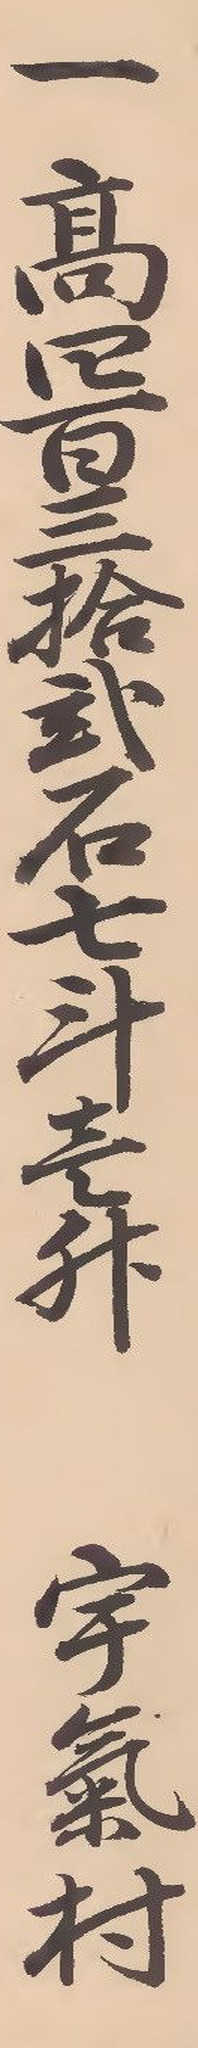一高四百三拾弐石七斗壱升宇気村
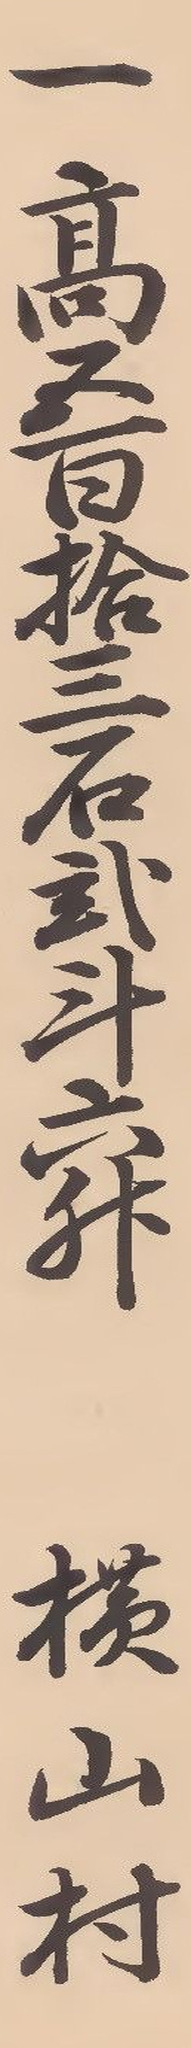一高五百拾三石弐斗六升横山村
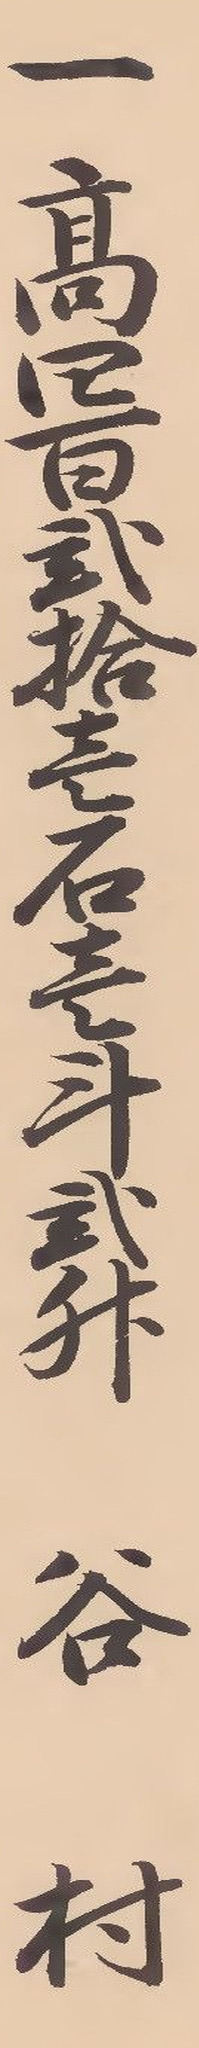一高四百弐拾壱石壱斗弐升谷村
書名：加賀国郷帳
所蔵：国立公文書館 National Archives of Japan
